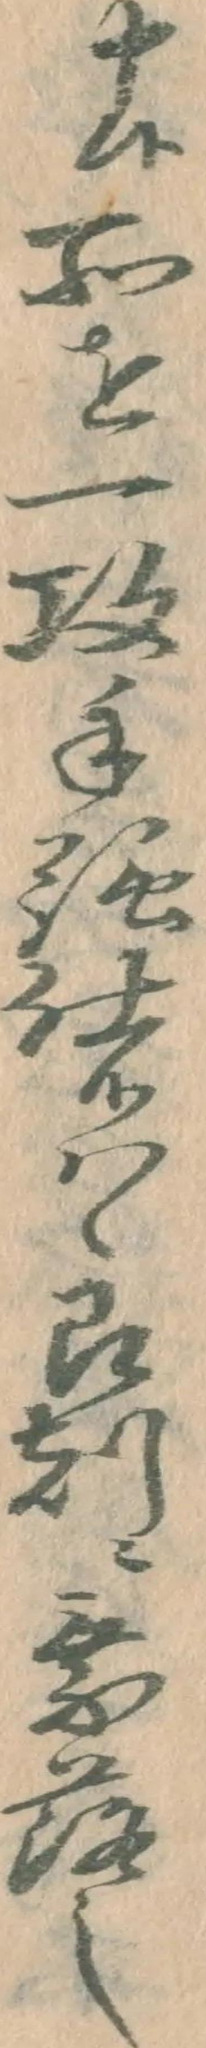申候所を一攻手強仕候はゝ即刻に乗落し
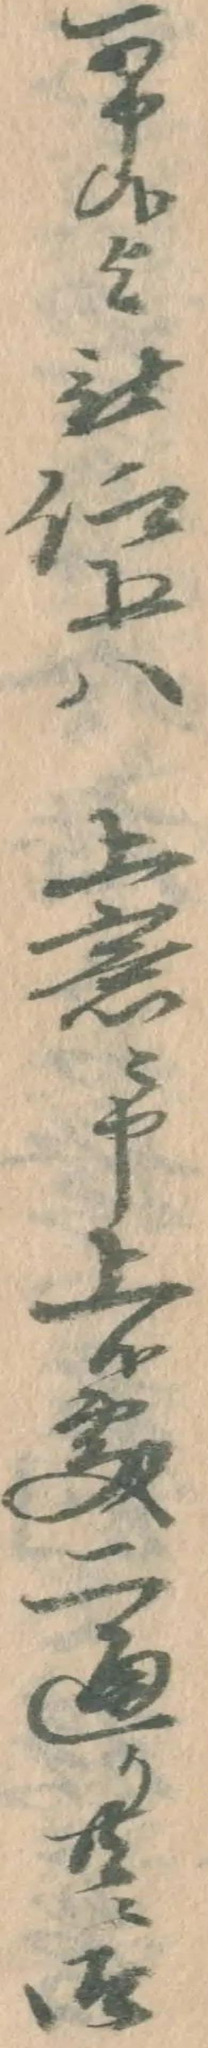可申候与被仰上は上意に申上候處二通り共に御

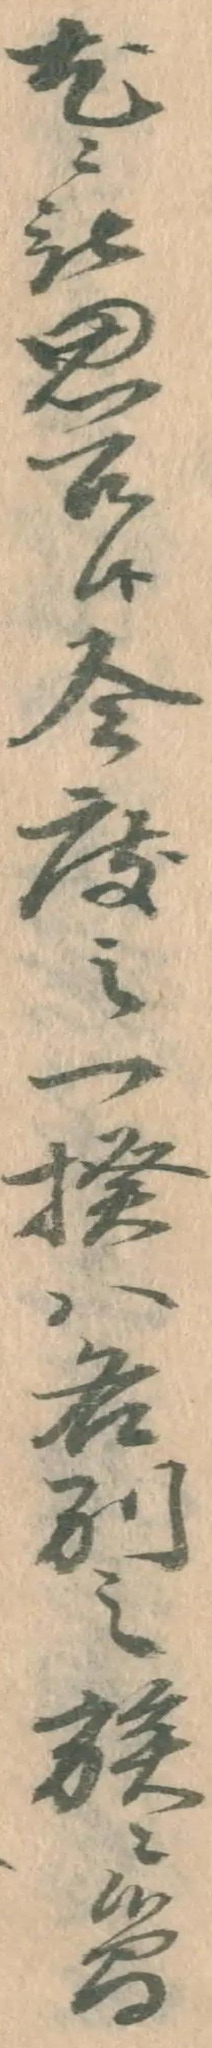尤に被思召候今度之一揆は各別之族に候間
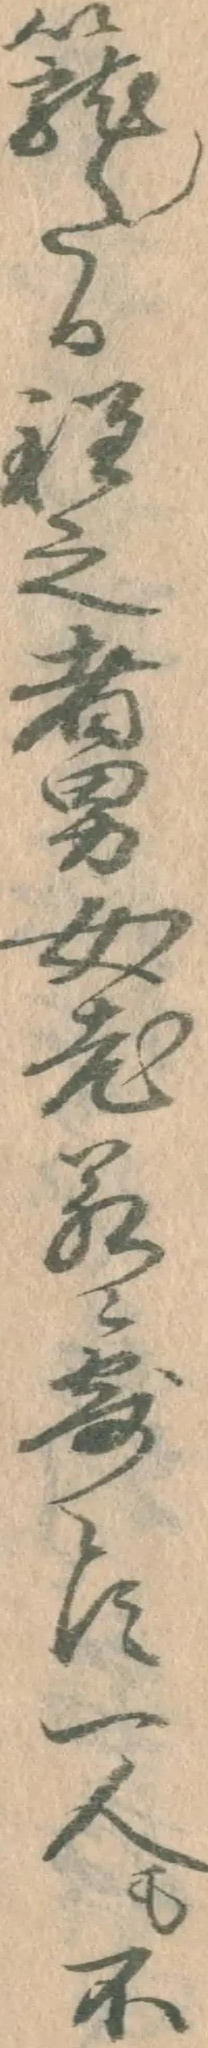籠たる程之者男女老若に寄ら須一人も不
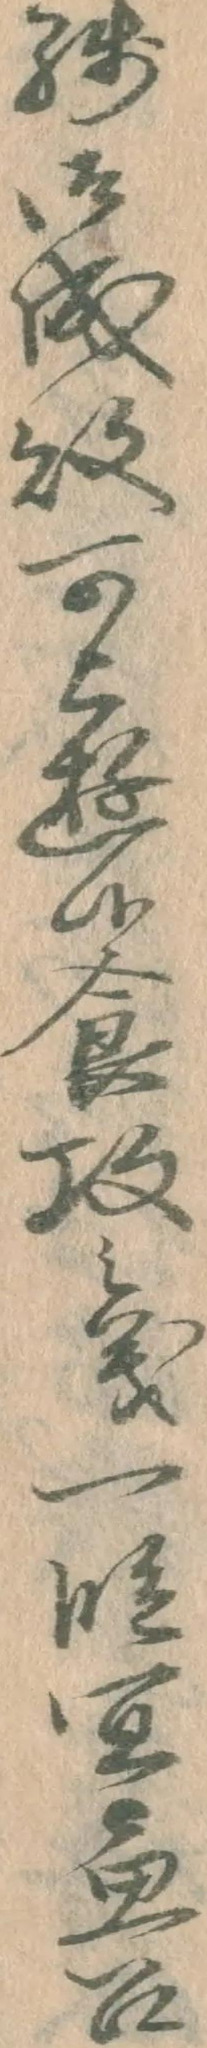残御成敗可被遊候食攻之義一段宜被思召
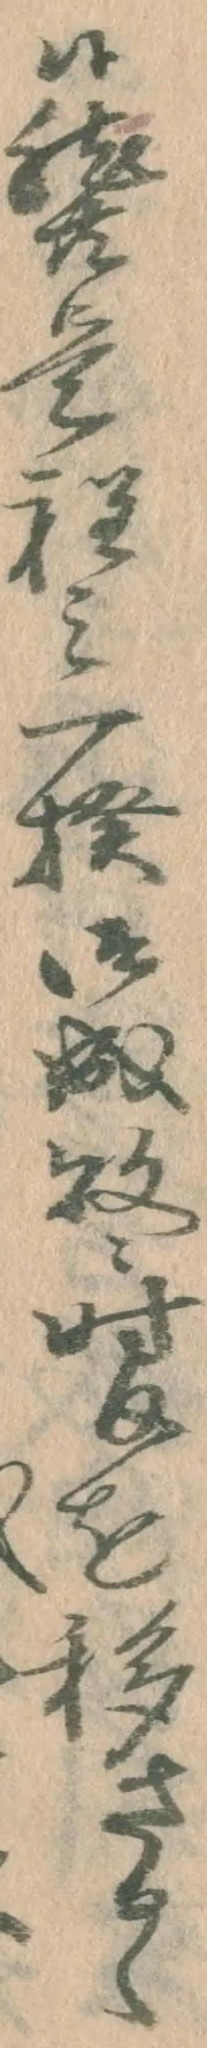候然共是程之一揆御成敗に時日を移さるゝ
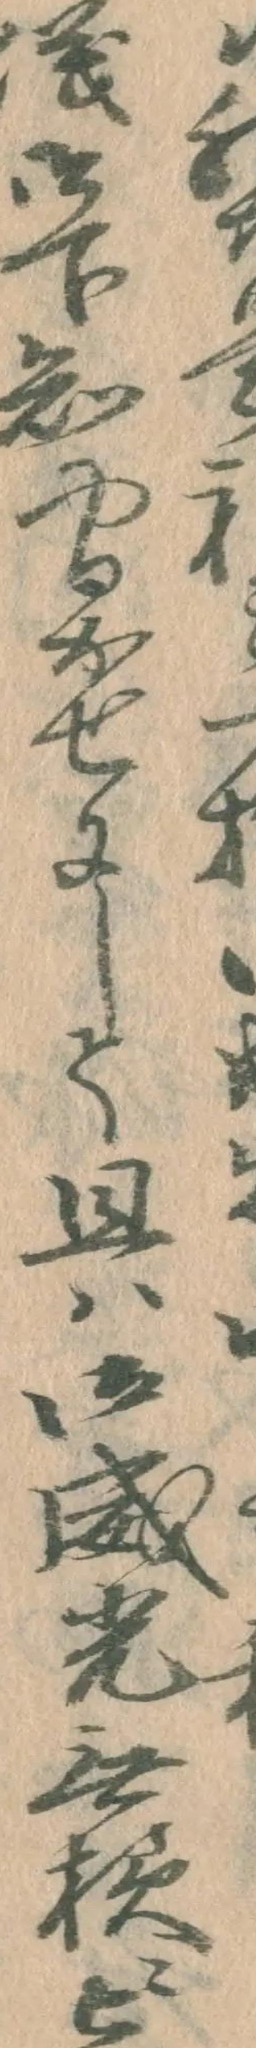儀御下知ゆるかせ尓して且は御威光無様に被
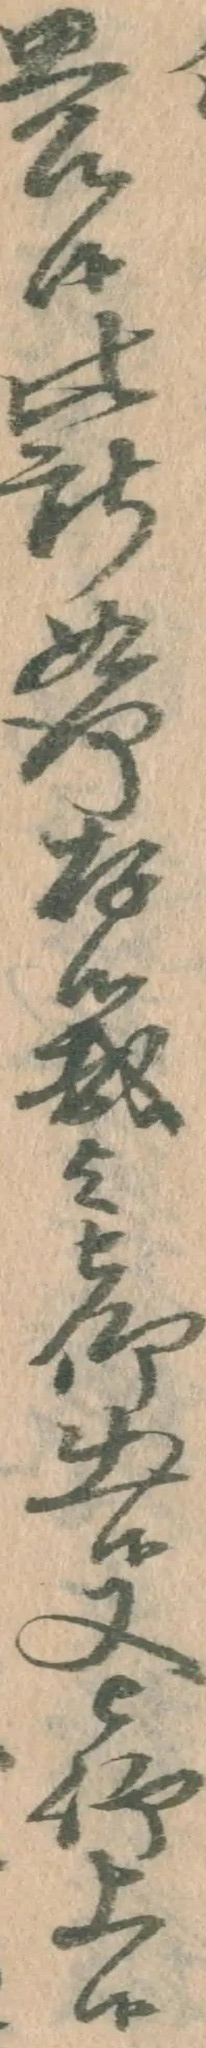思召候此所如何存候哉与被仰出候又被仰上候
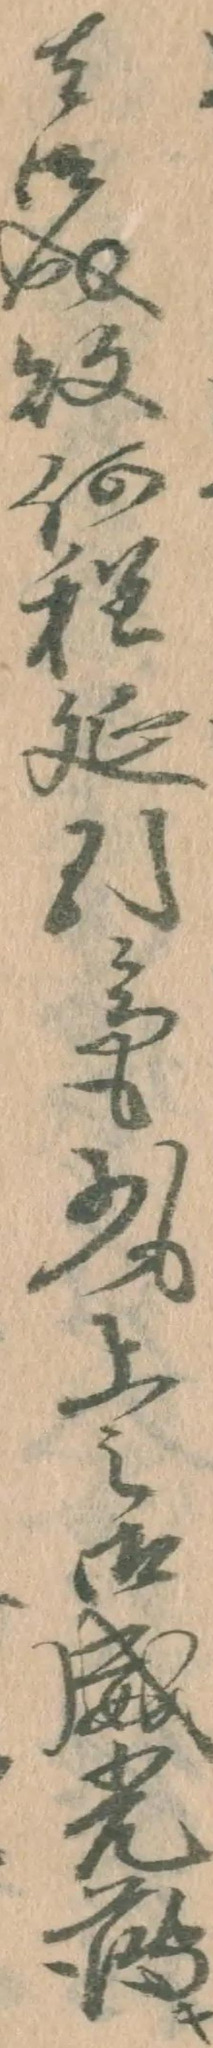者御成敗何程延引に而も少も上之御威光薄き
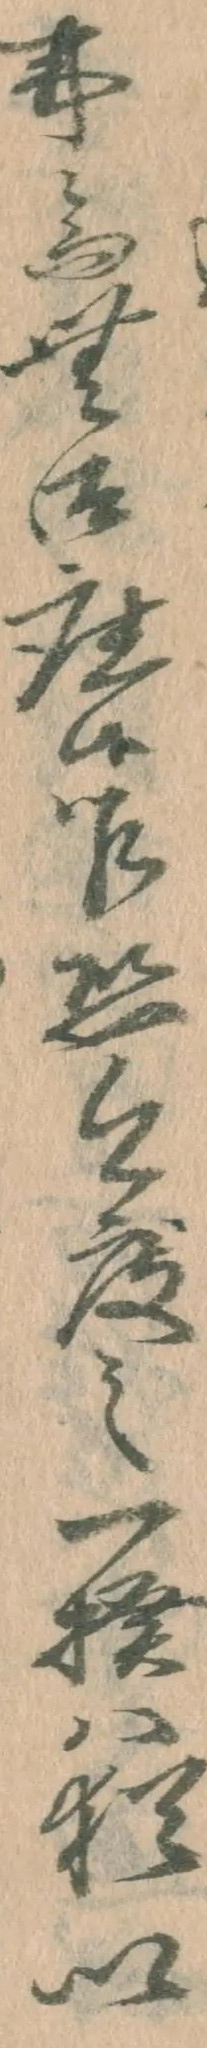事に而無御座候乍恐今度之一揆は猶以
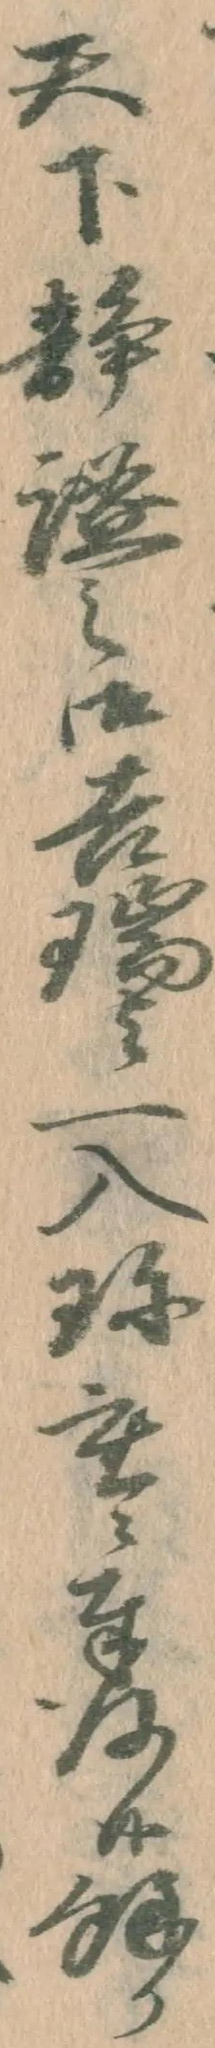天下静謐之御吉瑞与一入珍重に奉存候余り
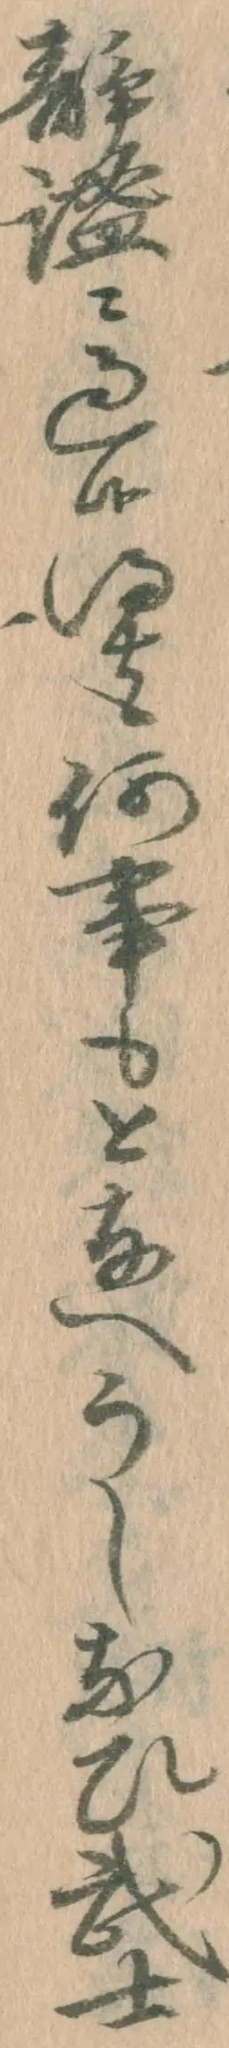静謐に過候得者何事もとなへうしなひ武士
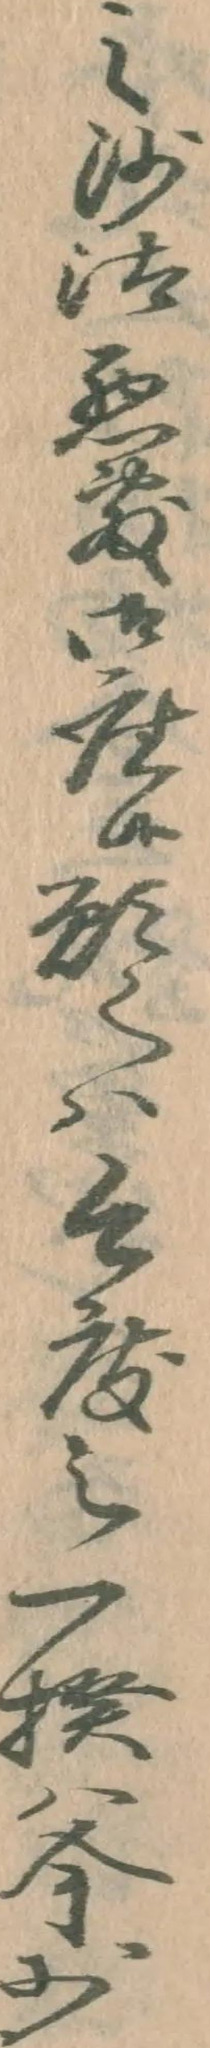之沙汰悪敷御座候願くは今度之一揆は今少
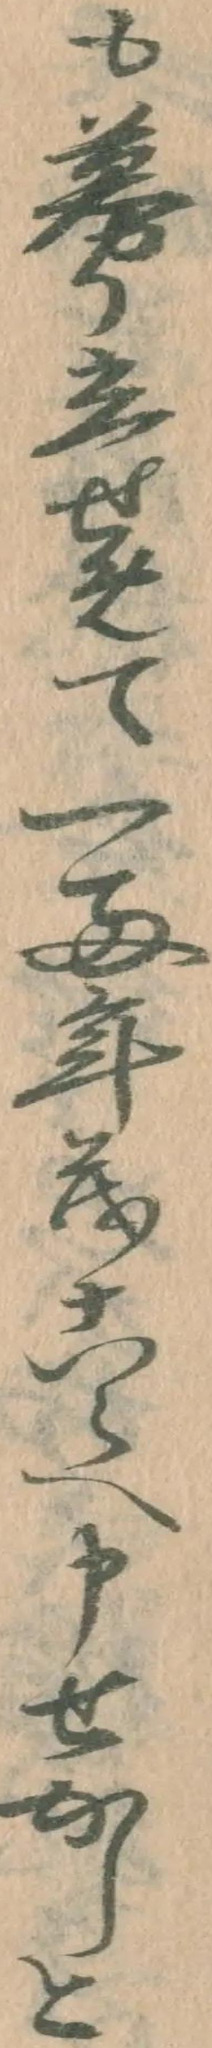も募り立せ免て一両年茂古らへ申せ加しと
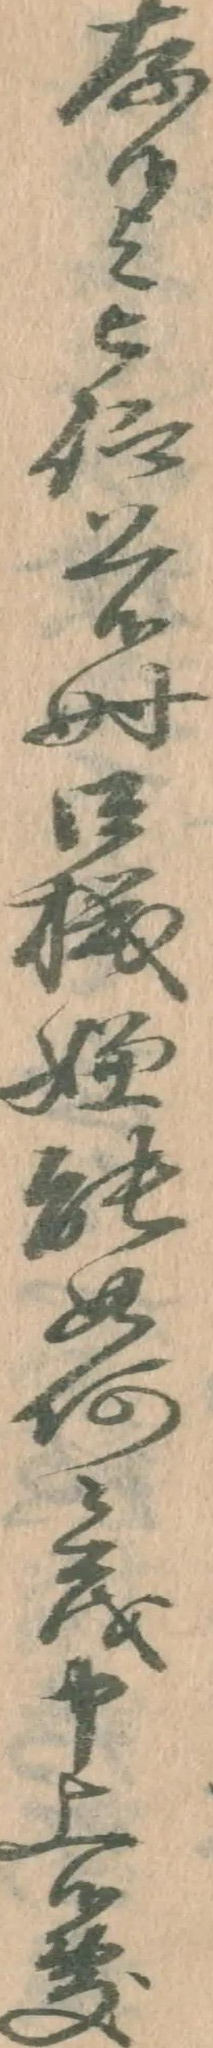存候与被仰上候時御機嫌能如何に茂申上候處
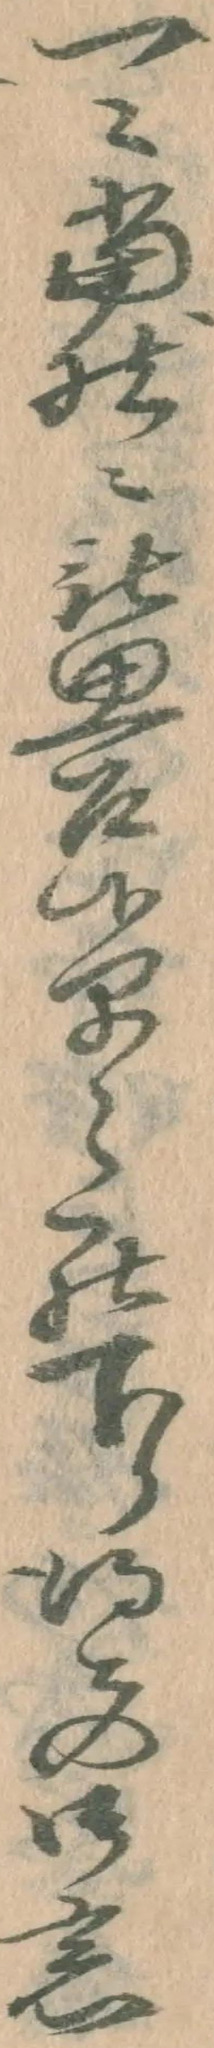一々当然に被思召候早々罷下り得との御意
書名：切支丹御退治記 49巻. [4]
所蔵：国立国会図書館 National Diet Library, JAPAN
